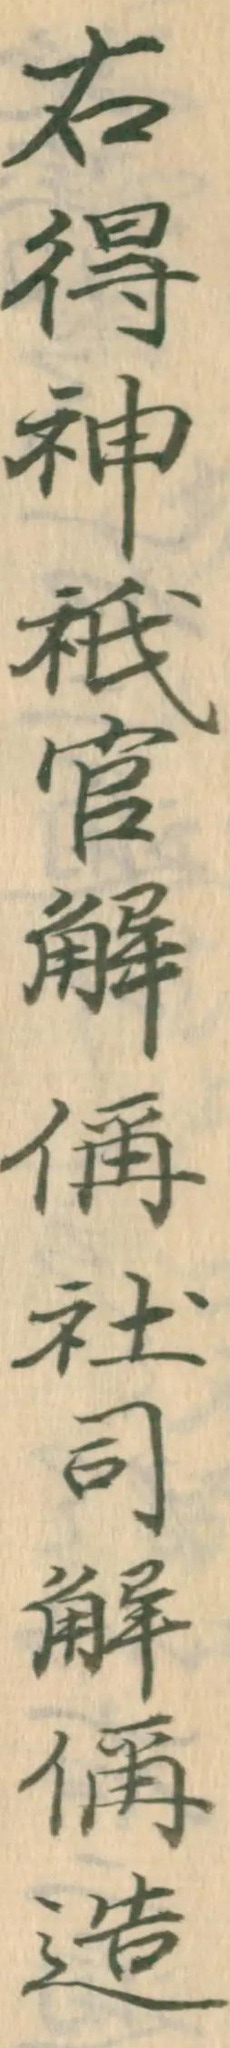右得神祇官解備社司解備造
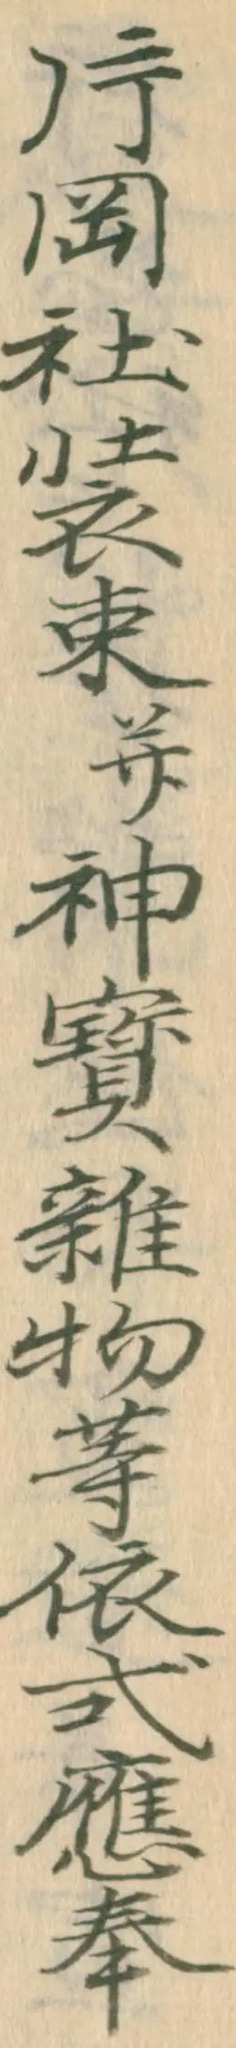片岡社装束并神宝雑物等依式応奉
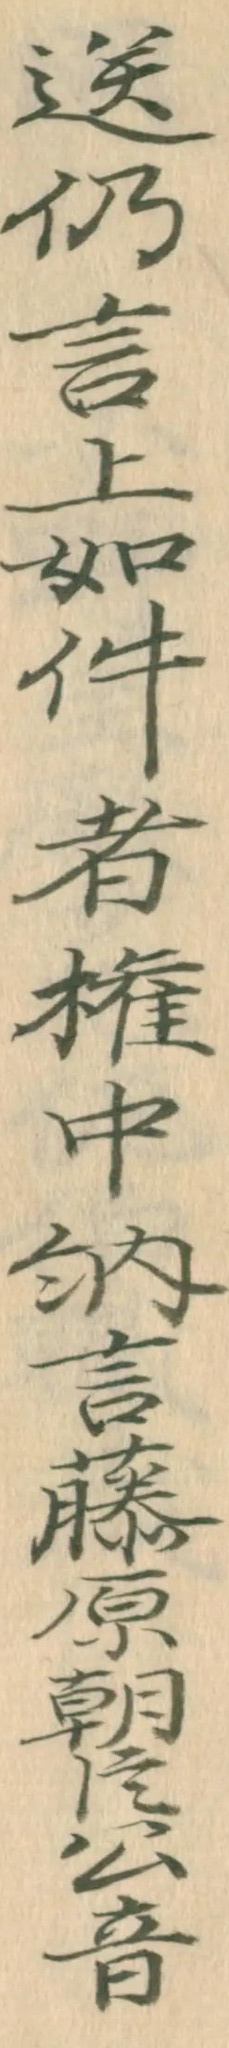送仍言上如件者権中納言藤原朝臣公音
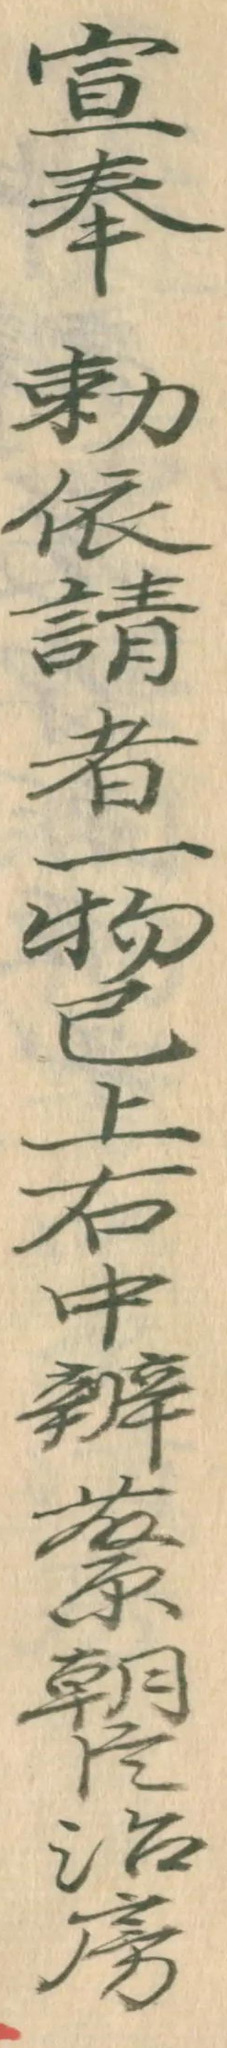宣奉勅依請者一物已上右中弁藤原朝臣治房
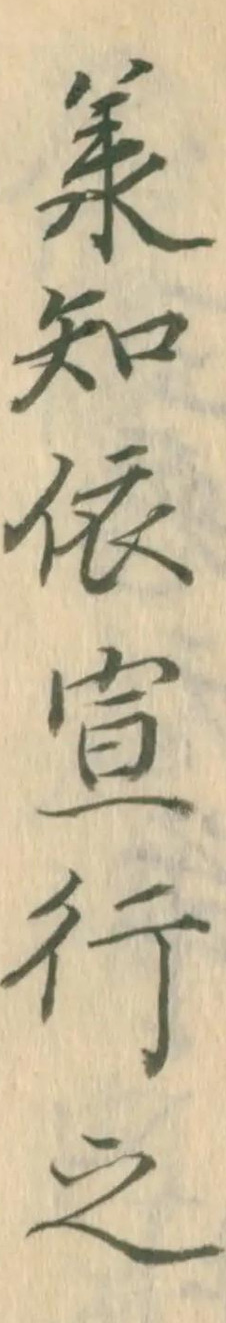承知依宣行之

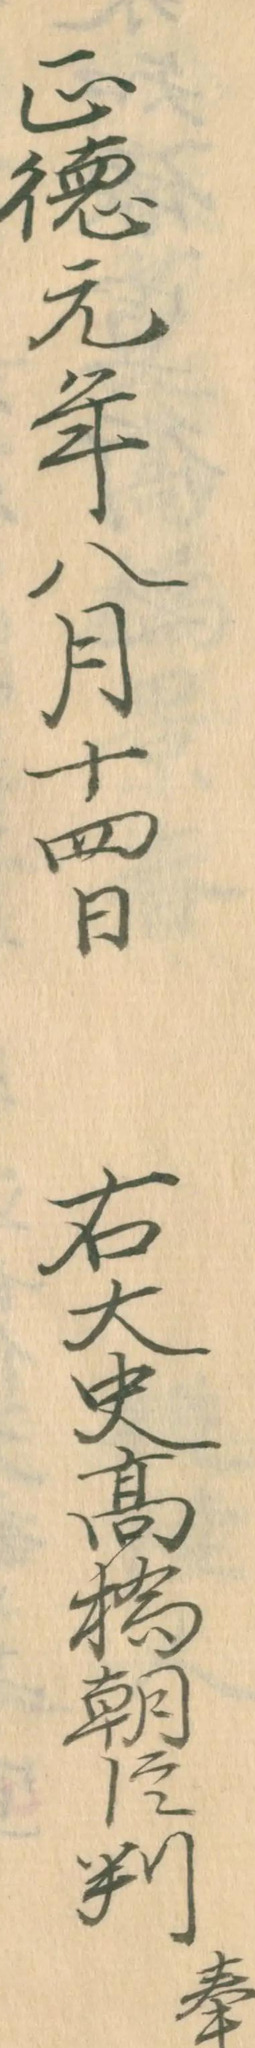正徳元年八月十四日右大史高橋朝臣判奉
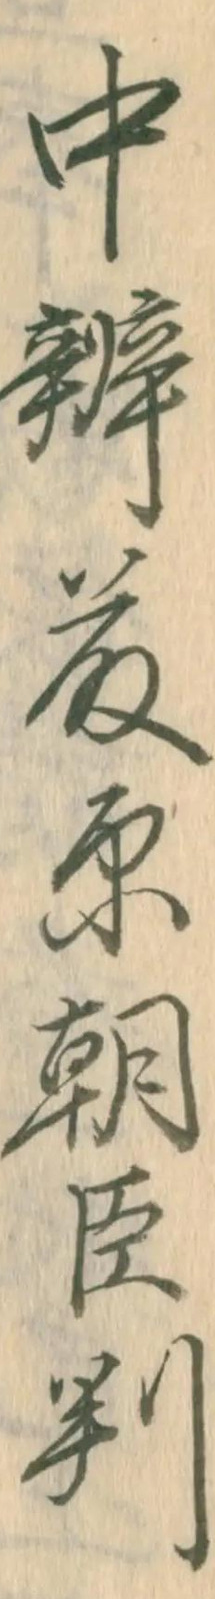中弁藤原朝臣判
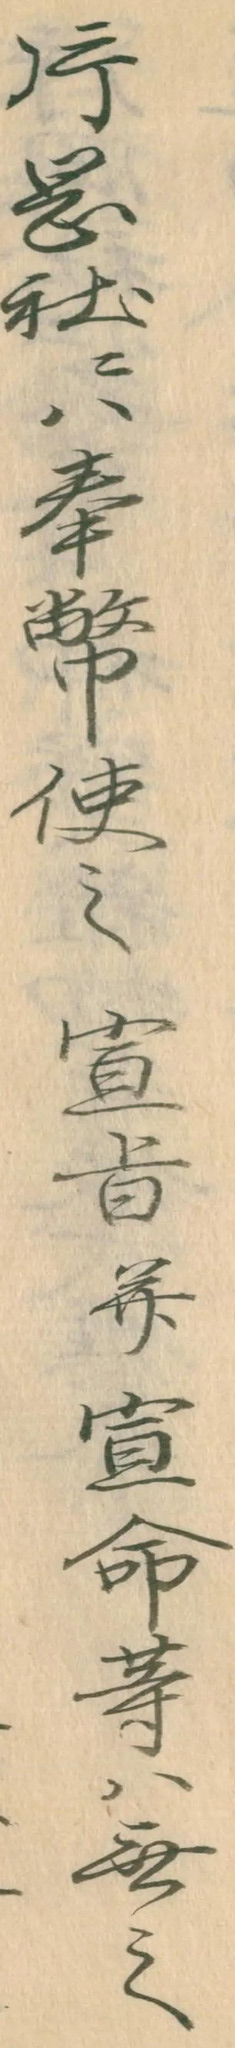片岡社ニハ奉幣使之宣旨并宣命等ハ無之
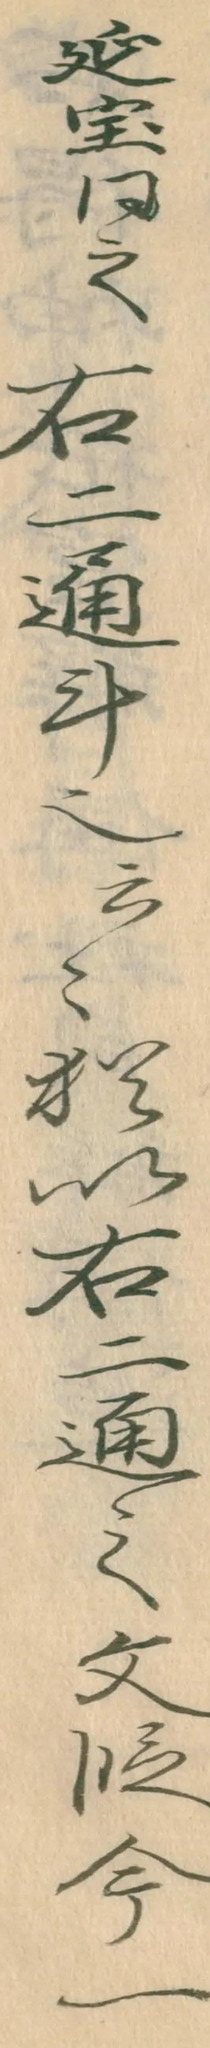延宝同之右二通計也云々猶以右二通之文段今一
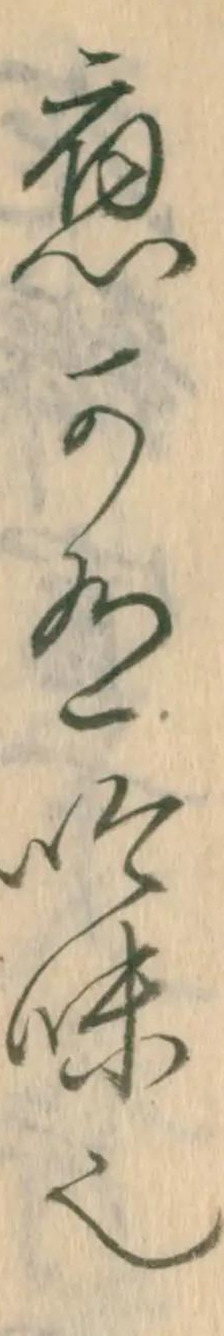応可有吟味也
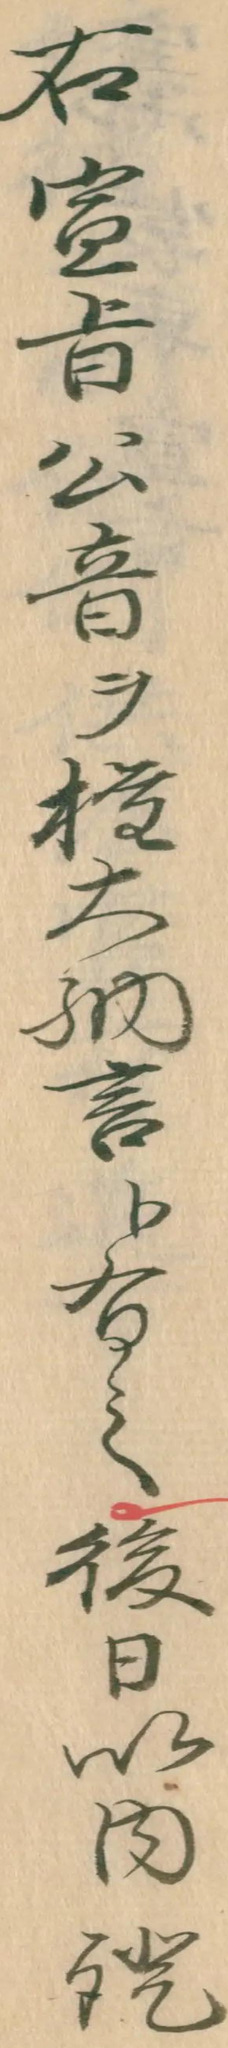右宣旨公音ヲ権大納言ト有之￮後日以内証
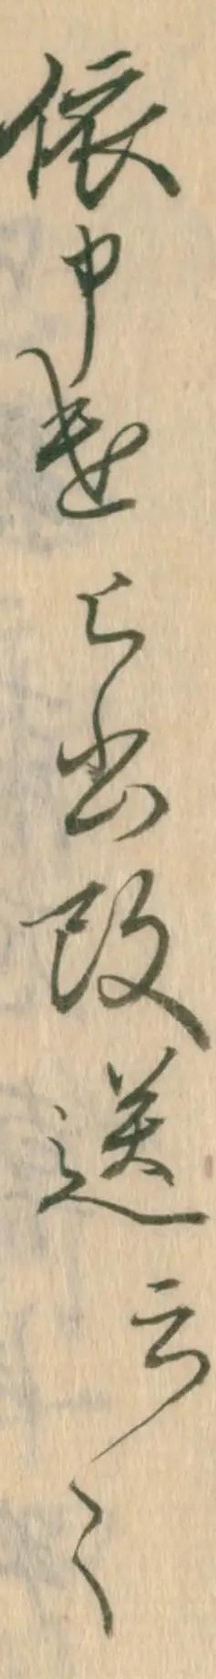依申遣被書改送云々
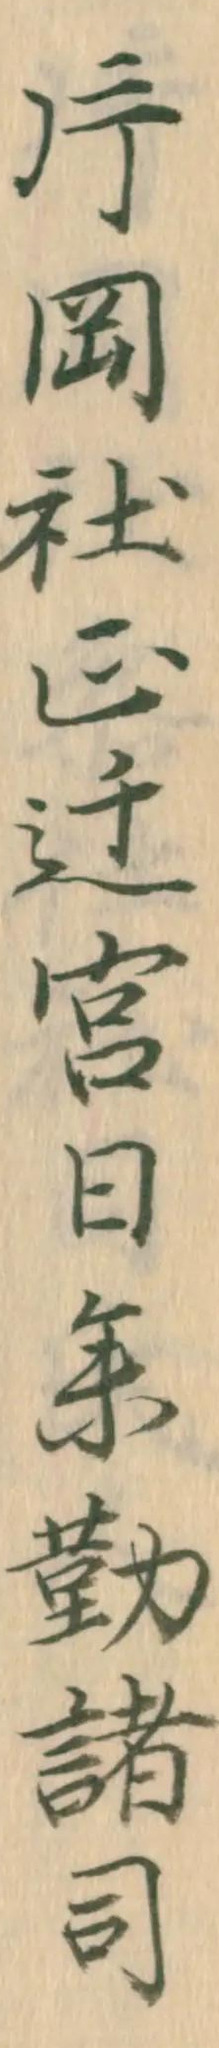片岡社正迁宮日参勤諸司
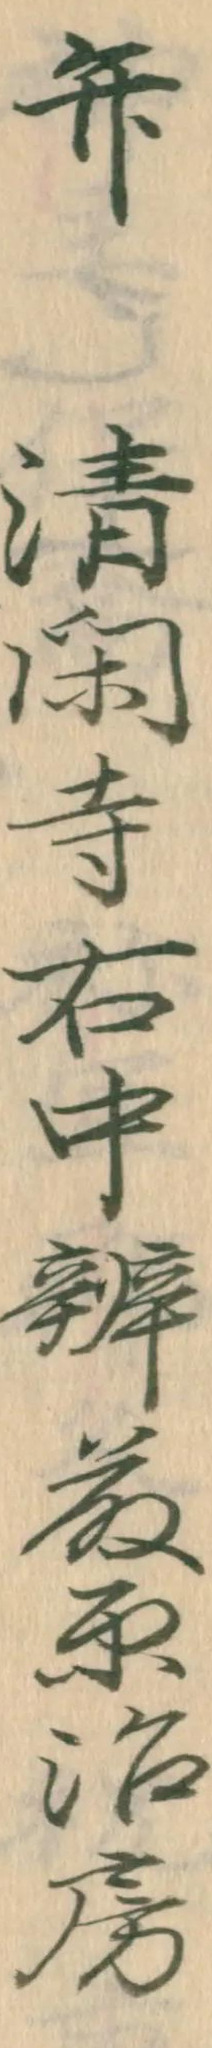弁清閑寺右中弁藤原治房
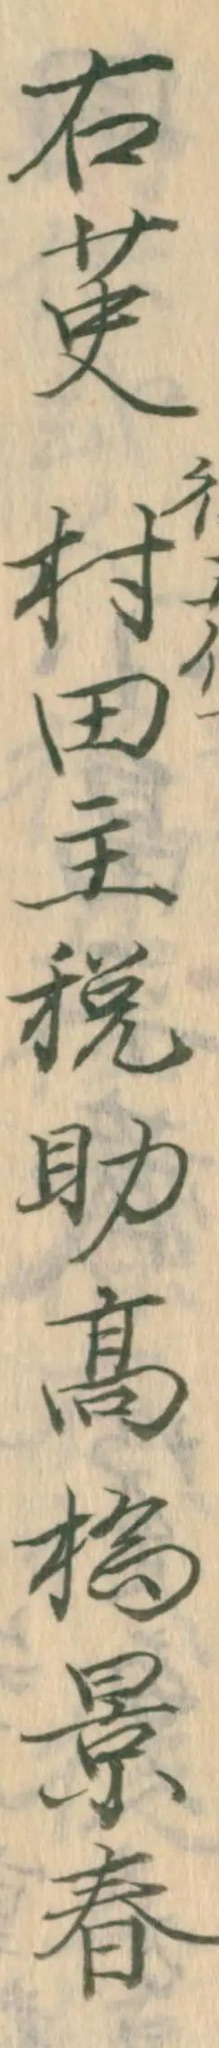右少史村田主税助高橋景春
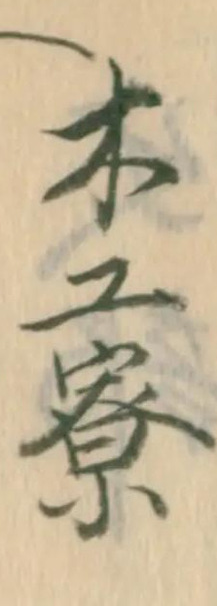木工寮
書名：賀茂社記録. 第16冊
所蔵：国立国会図書館 National Diet Library, JAPAN
